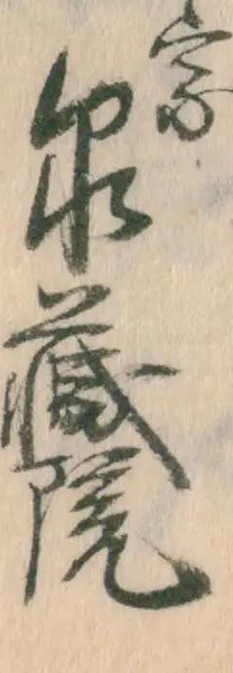泉蔵院

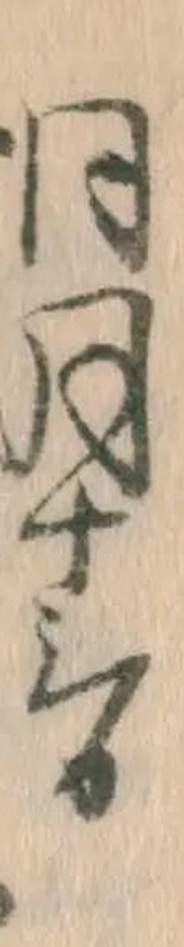同月廿三日
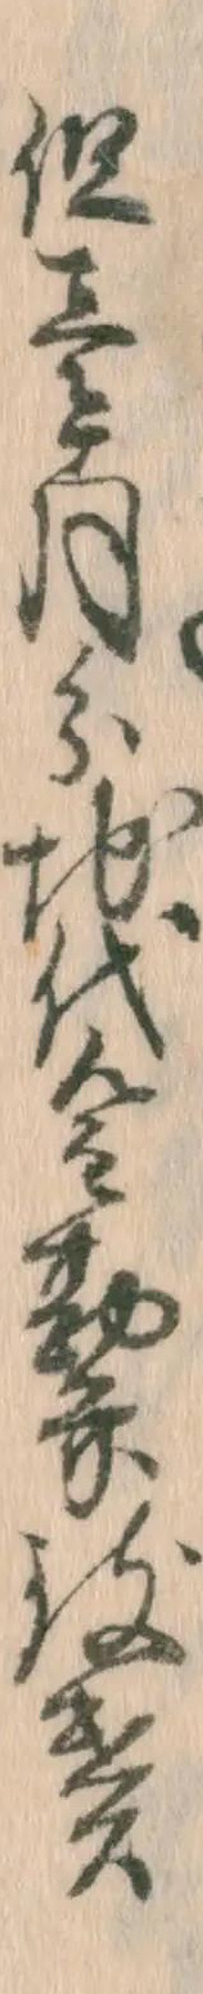但壱月分地代金勘弁致遣ス
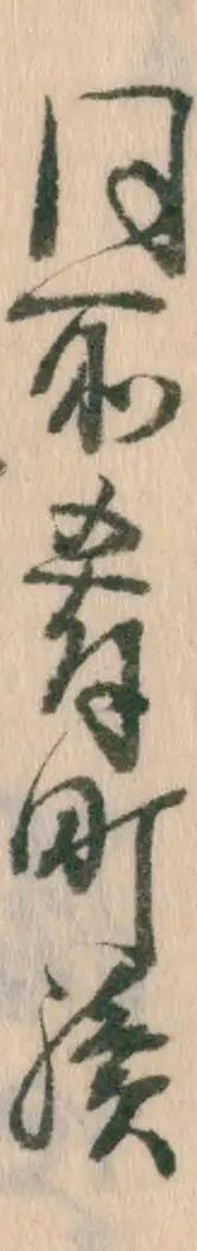同所肴町続
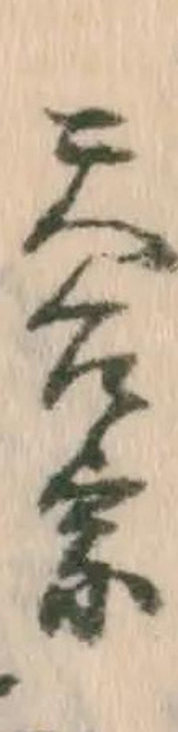天台宗
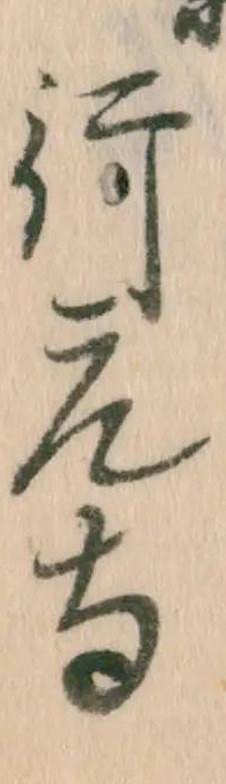行元寺
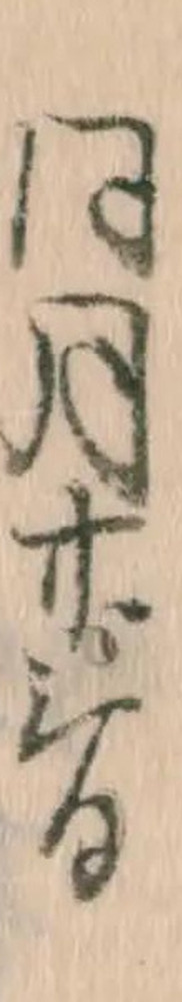同月廿三日
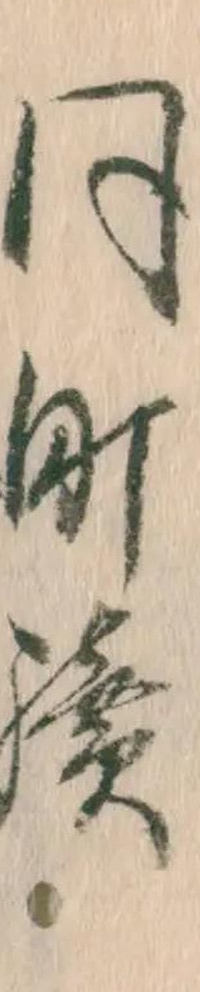同町続
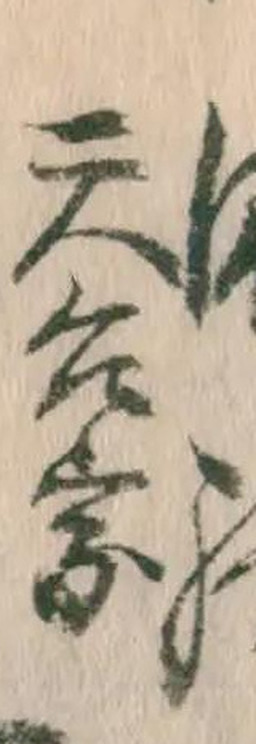天台宗
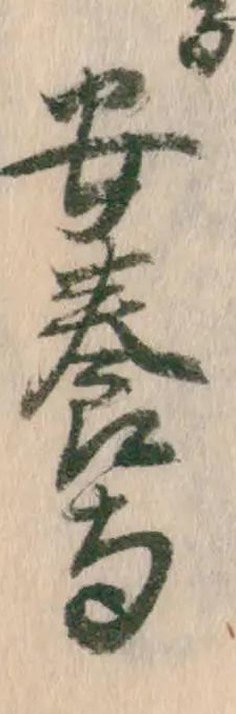安養寺
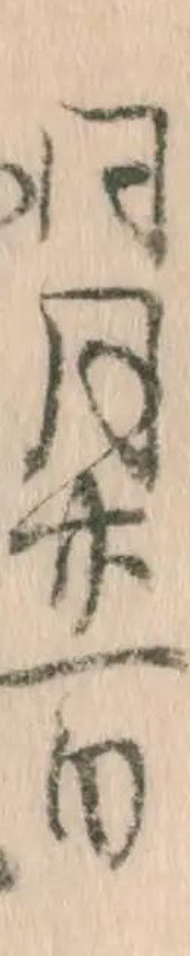同月廿一日

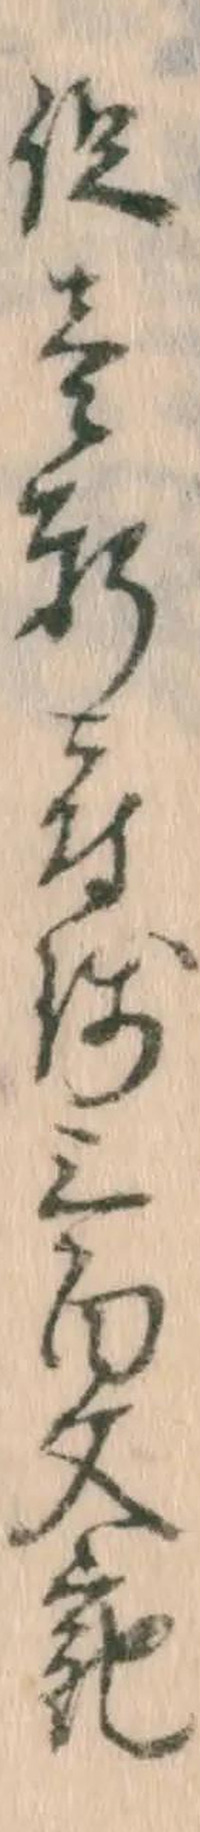但壱軒ニ付銭三百文宛
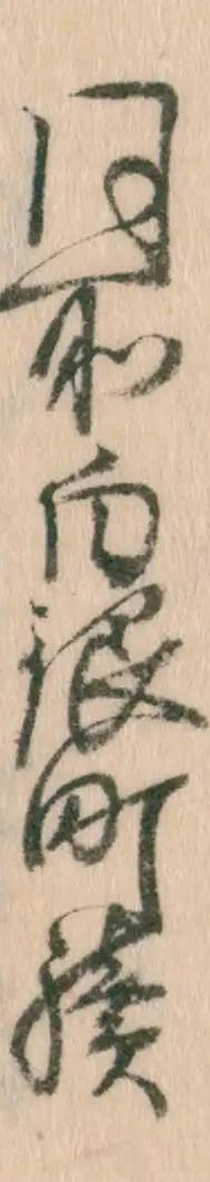同所白銀町続
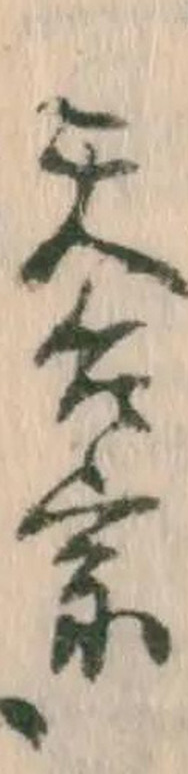天台宗
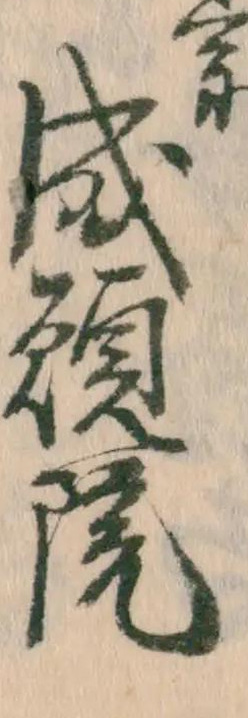成願院
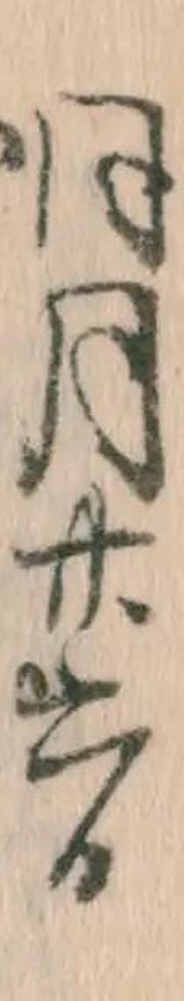同月廿九日
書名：武家方并寺院等ニテ施差出候一件
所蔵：国立国会図書館 National Diet Library, JAPAN
